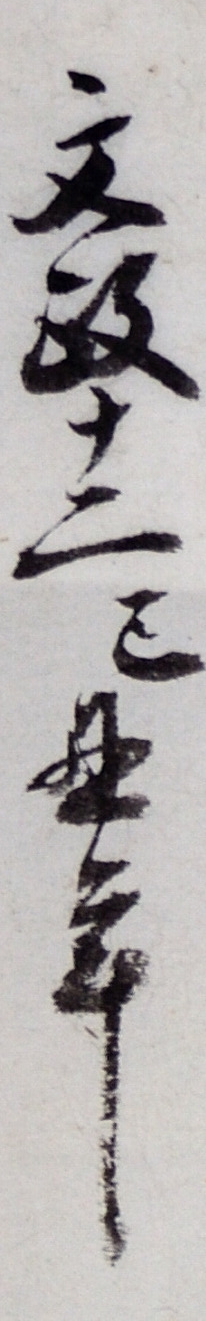文政十二己丑年
